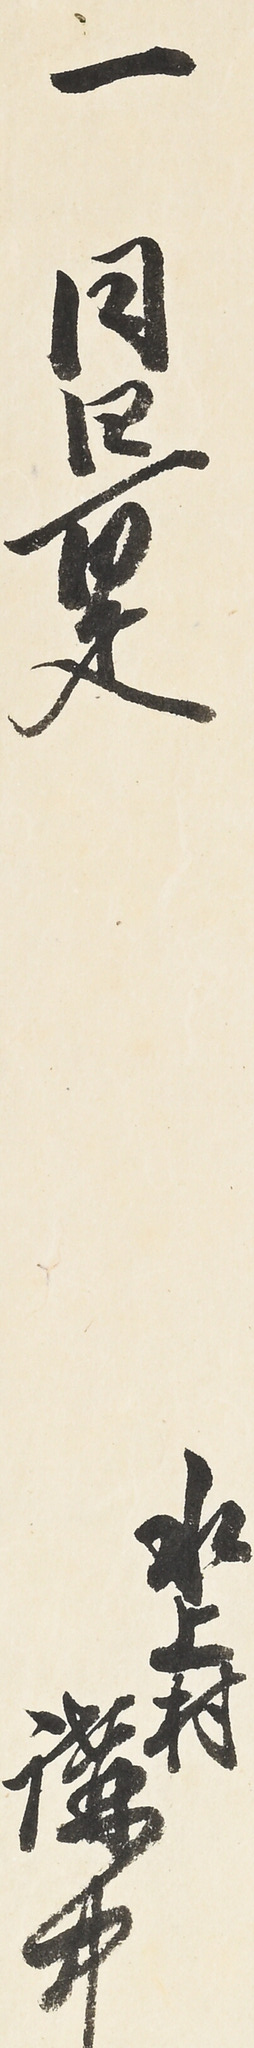一同四百疋講中
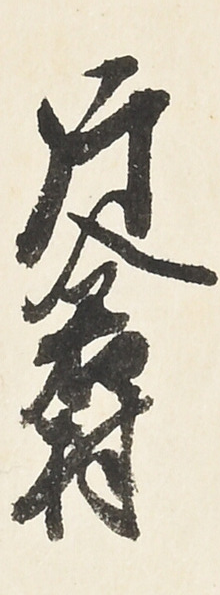片倉村
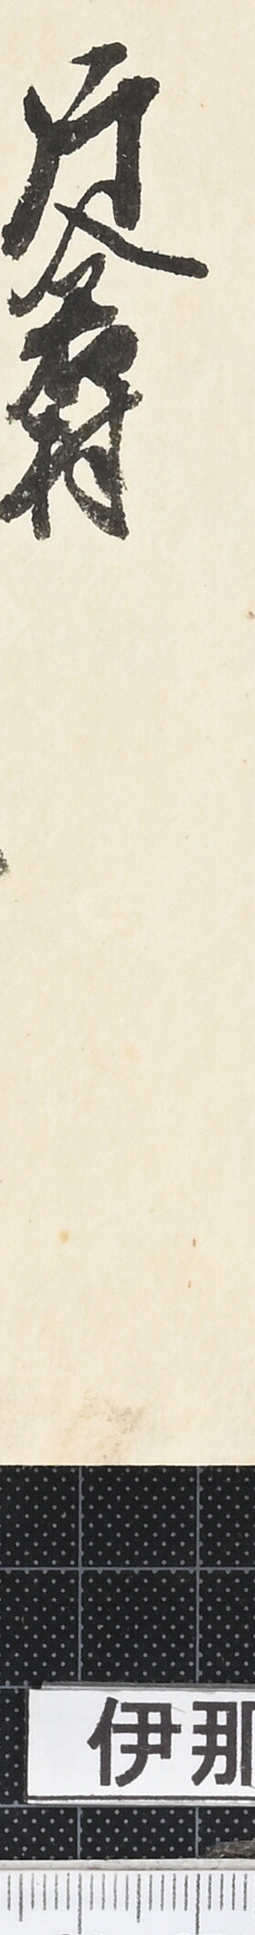片倉村
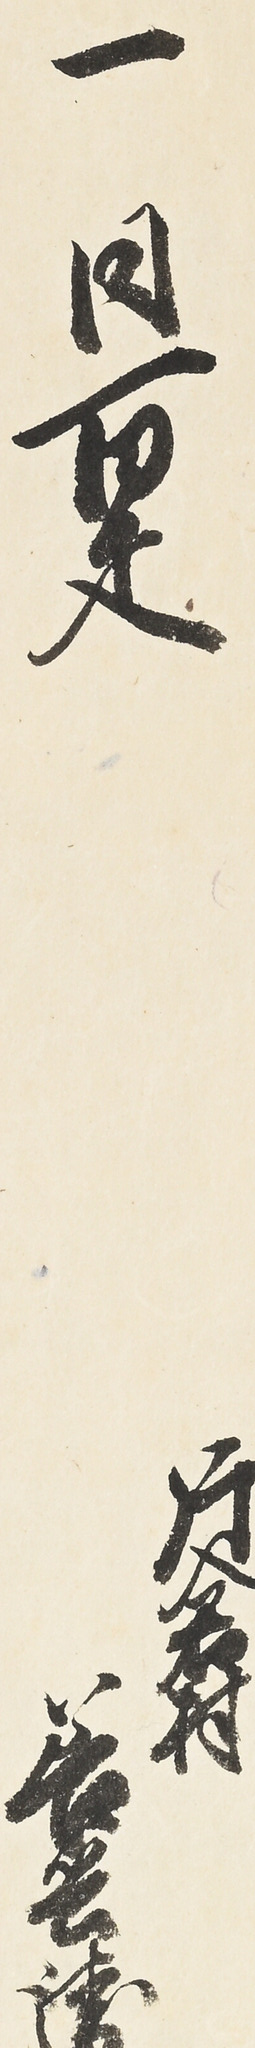一同百疋善兵衛

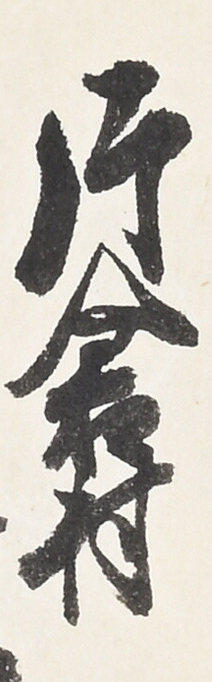片倉村
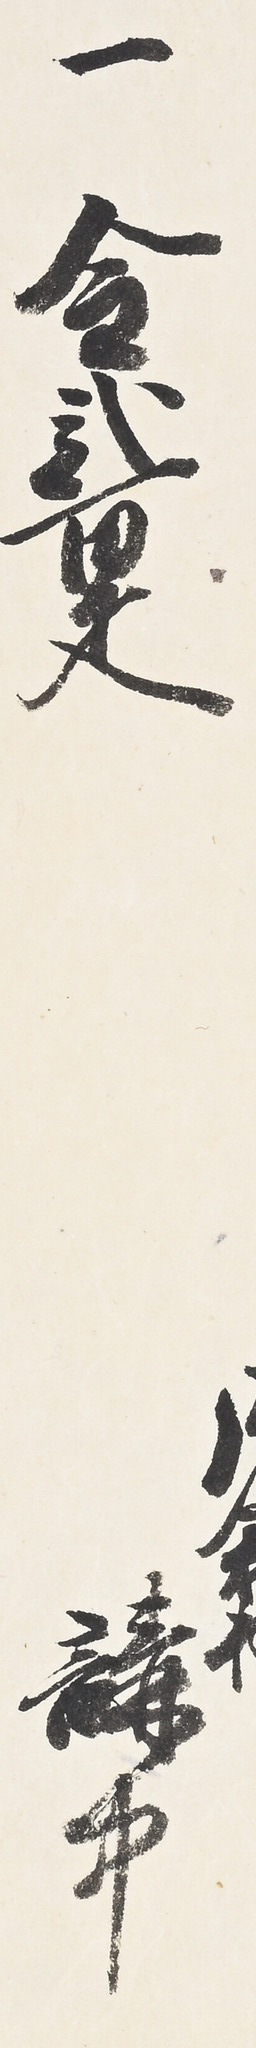一金弐百疋講中
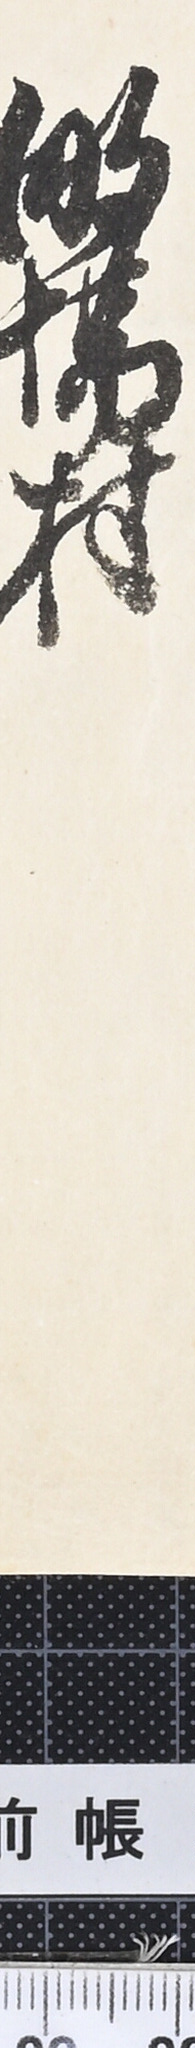的場村
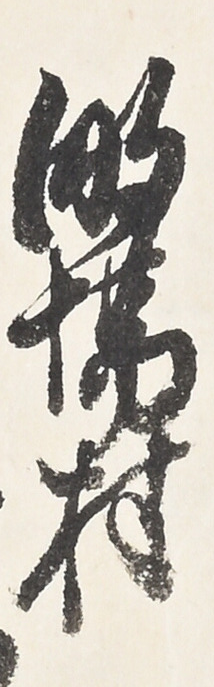的場村
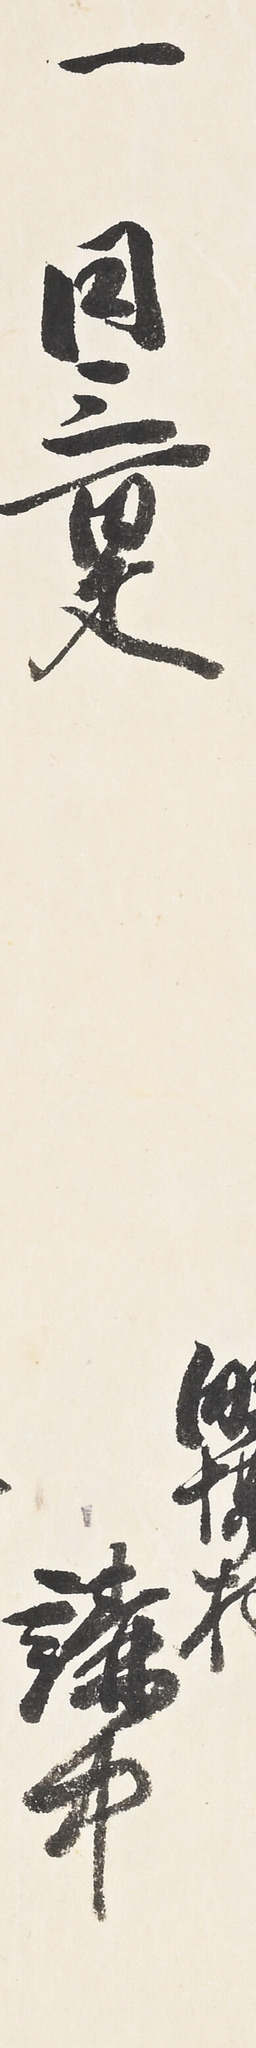一同三百疋講中
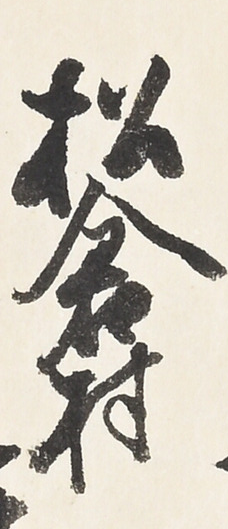松倉村
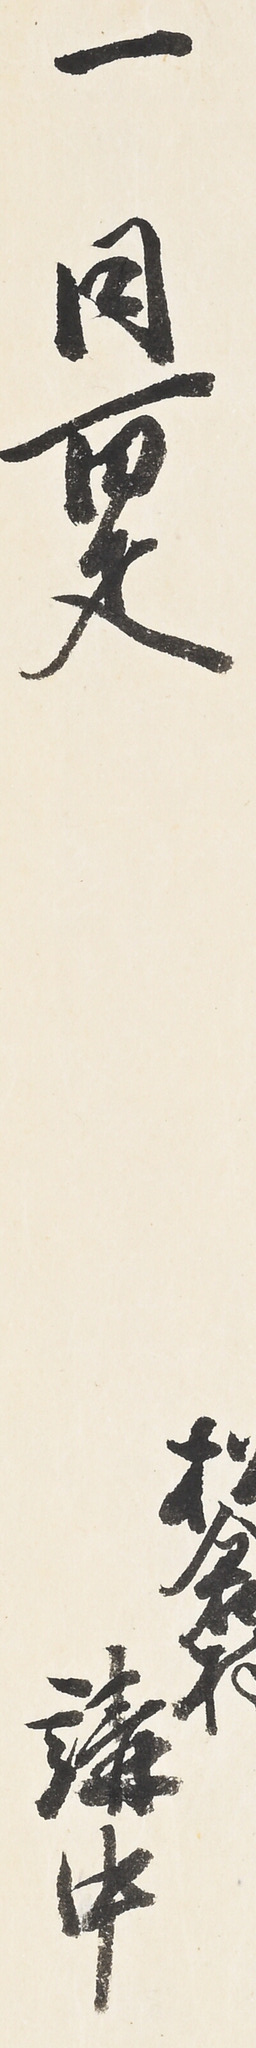一同百疋講中
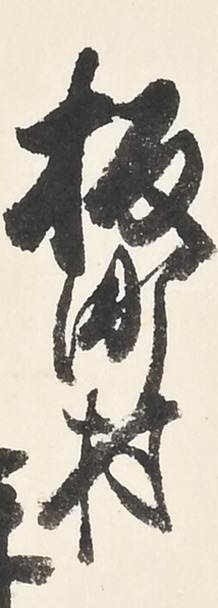板町村
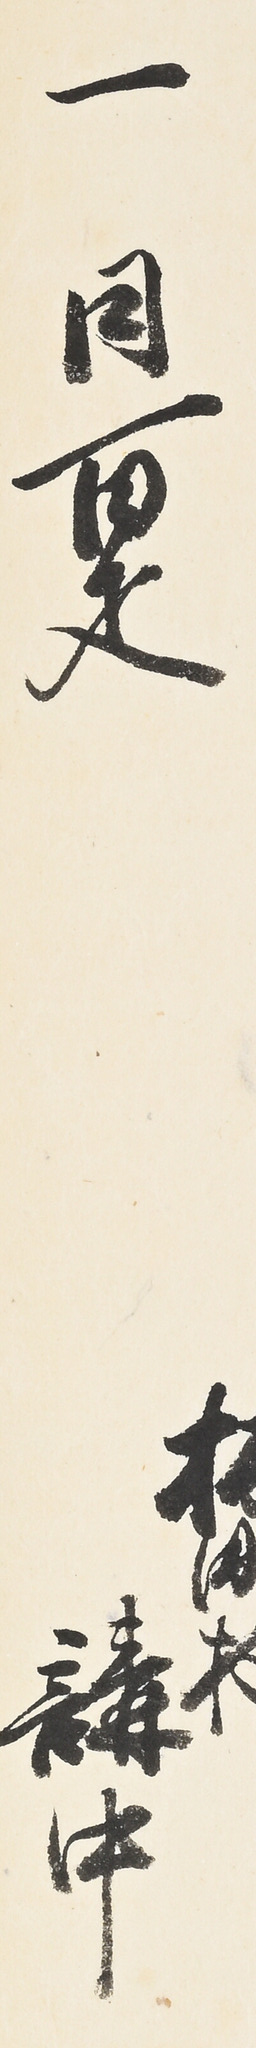一同百疋講中
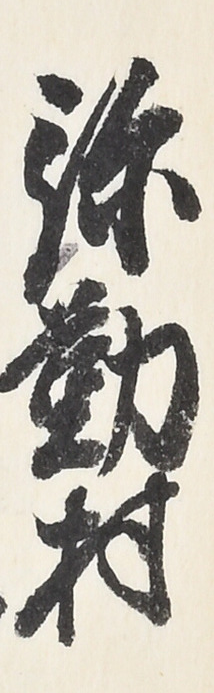弥勒村
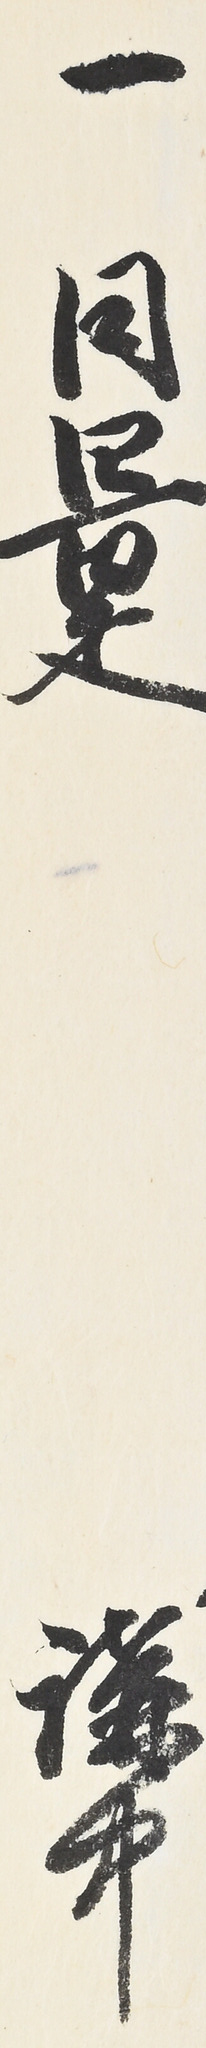一同四百疋講中
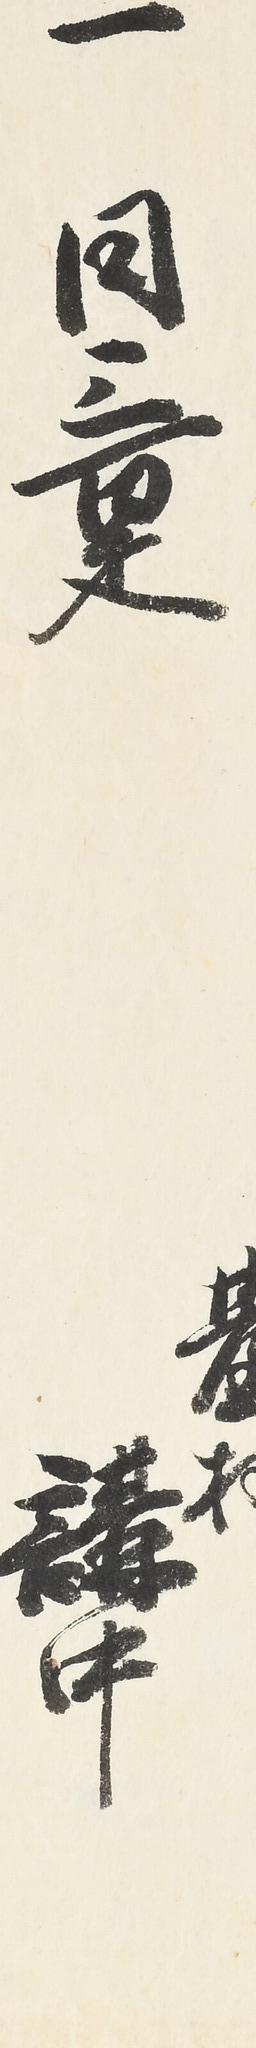一同三百疋講中
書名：永代太々御神楽名前帳
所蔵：伊那市立高遠町図書館・合同会社AMANE
